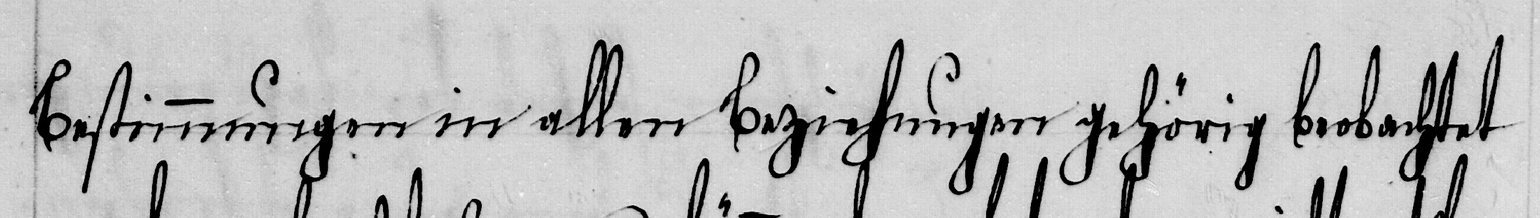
Bestimmungen in allen Beziehungen gehörig beobachtet
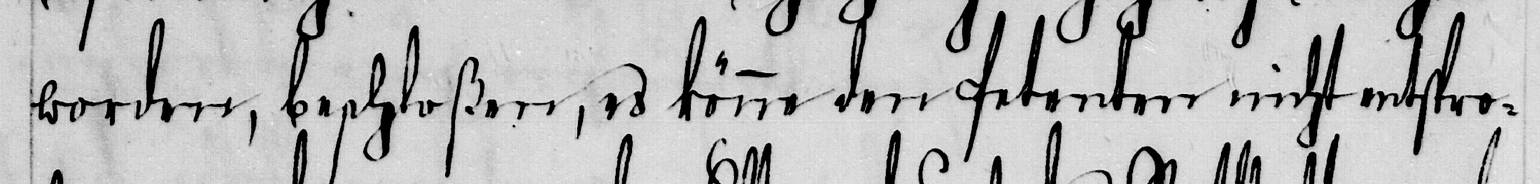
worden, beschloßen, es könne den Petenten nicht entspro¬
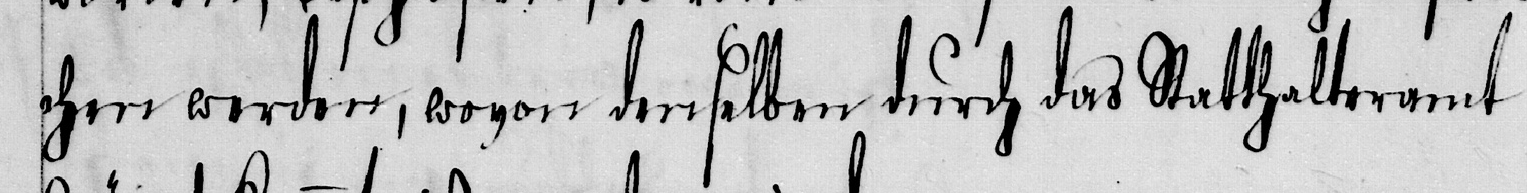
chen werden, wovon denselben durch Statthalteramt
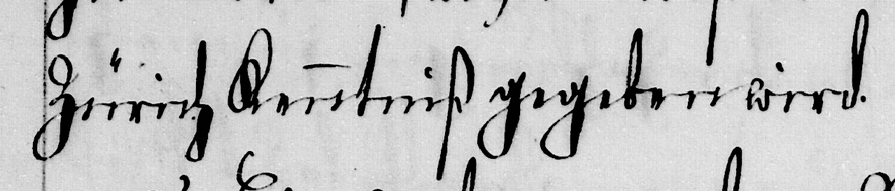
Zürich Kenntniß gegeben wird.
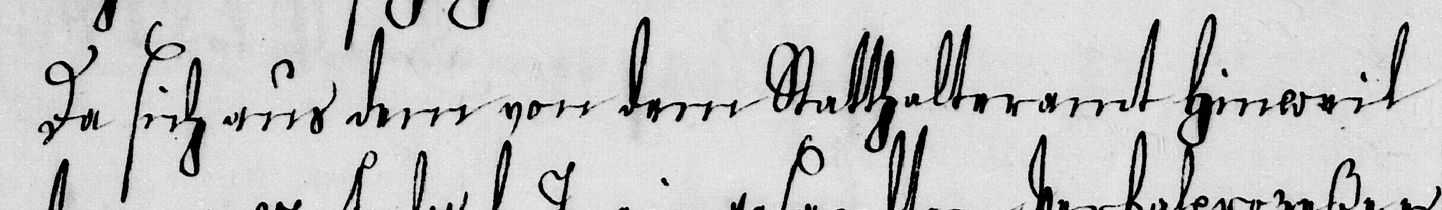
Da sich aus dem von dem Statthalteramt Hinweil
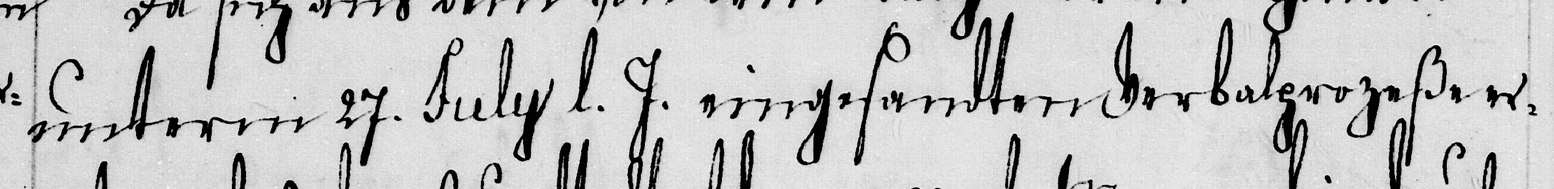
unterm 27. July l. J. eingesandten Verbalprozeße er¬
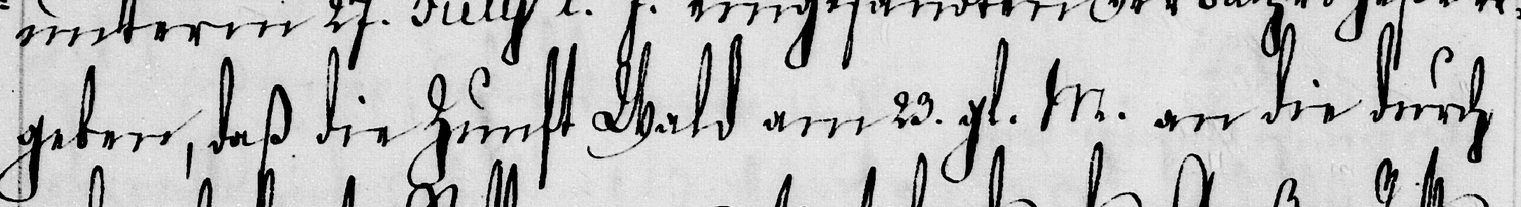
geben, daß die Zunft Wald am 23. gl. M. an die durch
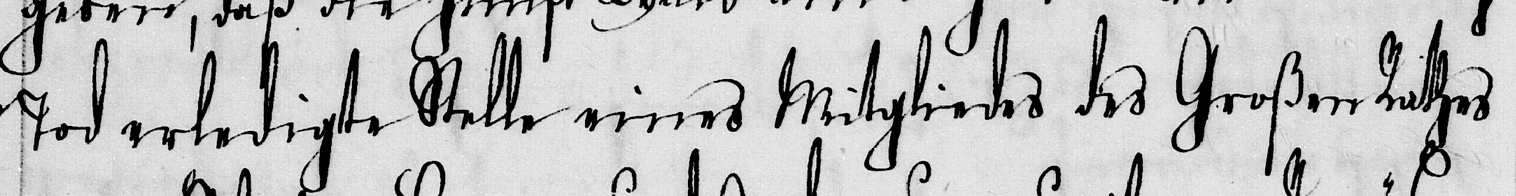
Tod erledigte Stelle eines Mitgliedes des Großen Rathes
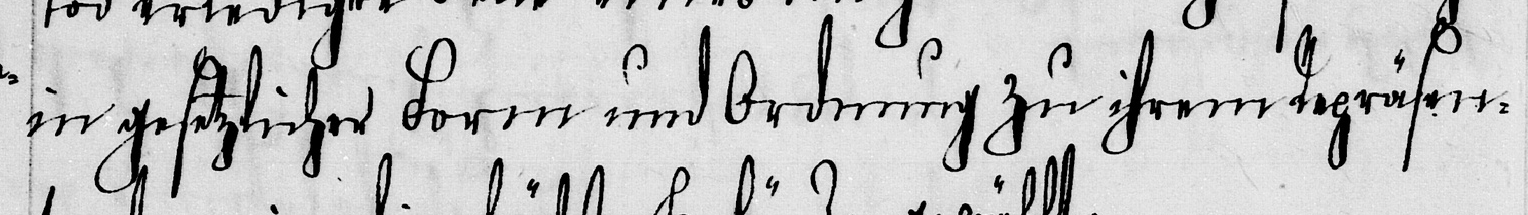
in gesetzlicher Form und Ordnung zu ihrem Repräsen¬
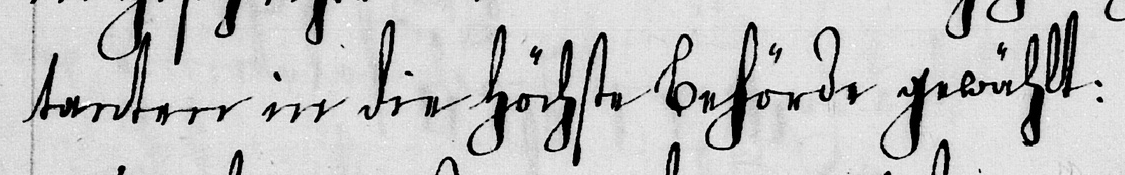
tanten in die Höchste Behörde gewählt:
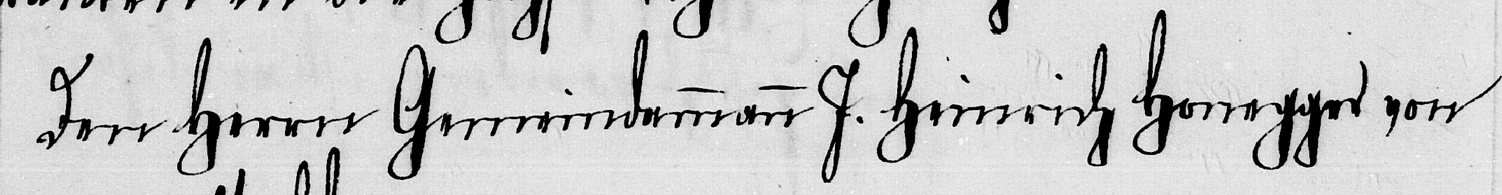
Den Herrn Gemeindammann J. Heinrich Honegger von
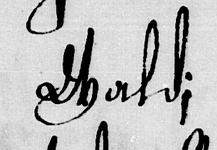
Wald;
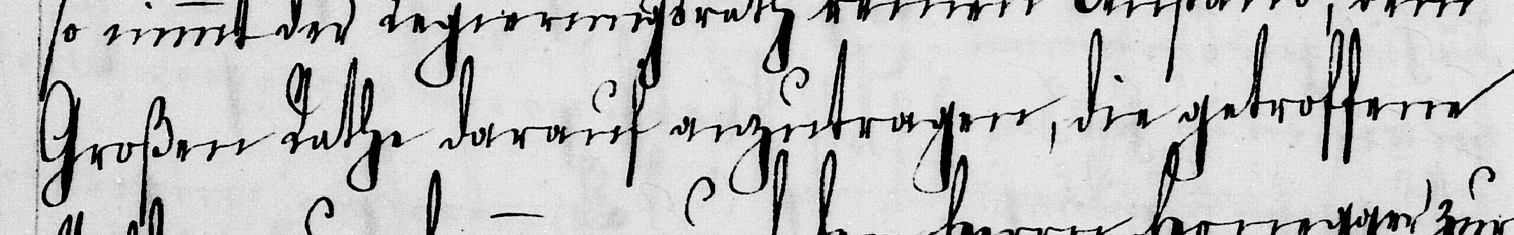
Großen Rathe darauf anzutragen, die getroffene
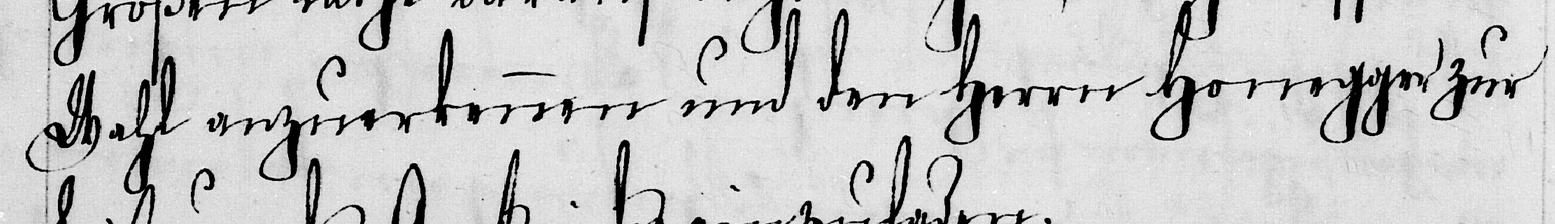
Wahl anzuerkennen und den Herrn Honegger zur
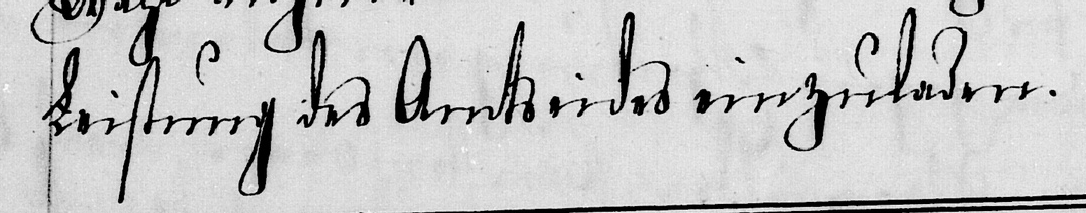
Leistung des Amtseides einzuladen.
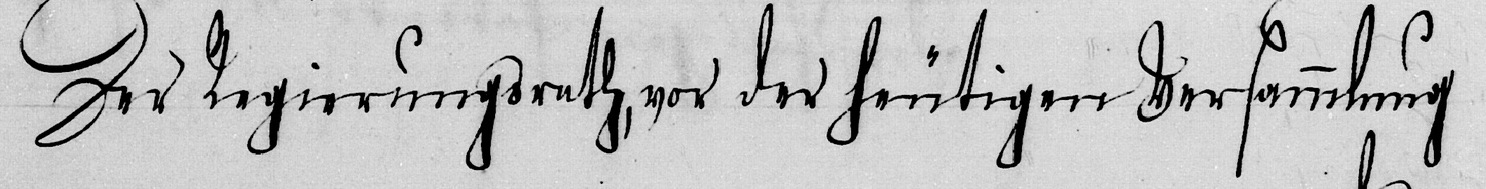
Der Regierungsrath, vor der heutigen Versammlung
